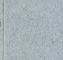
grüßt
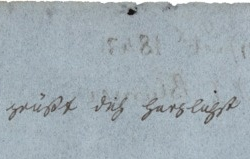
dein
